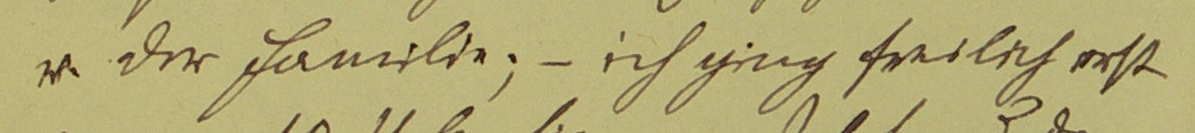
von der Familie,- ich ging freilich erst
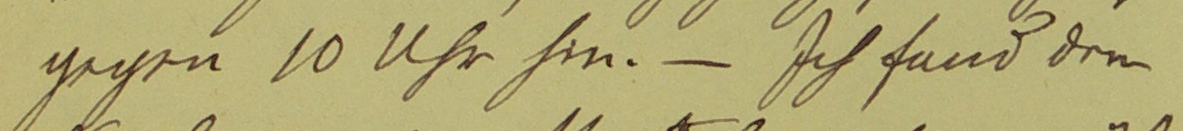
gegen 10 Uhr hin.- Ich fand den
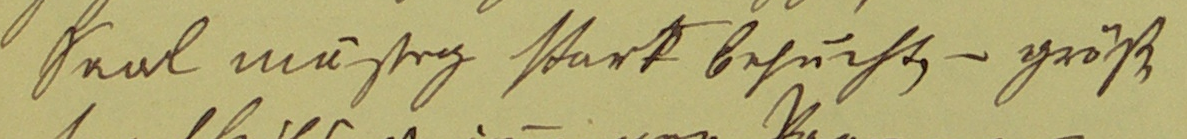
Saal mäßig stark besucht,- größ¬
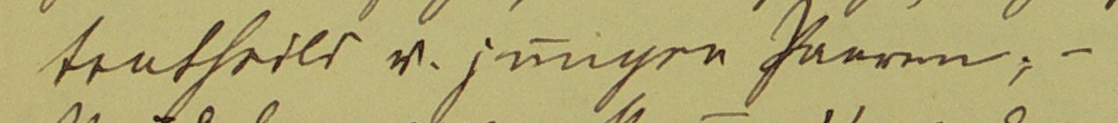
tentheils von jungen Paaren;-
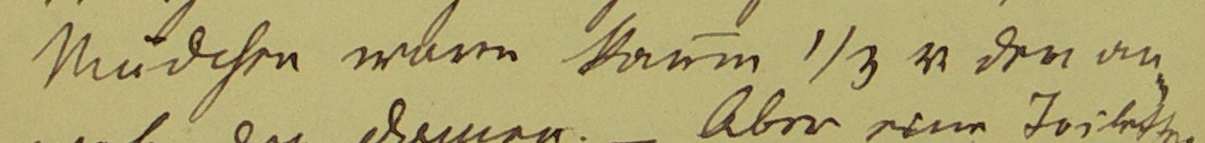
Mädchen waren kaum 1/3 von den an¬
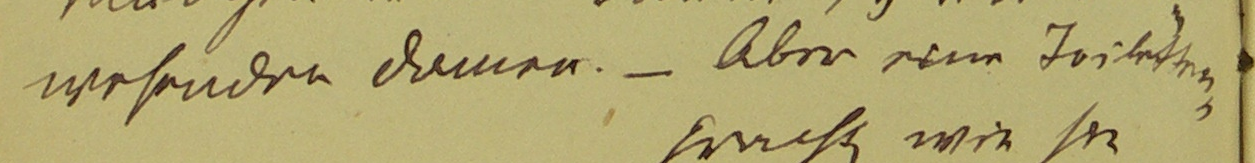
wesenden Damen. – Aber ein Toiletten¬
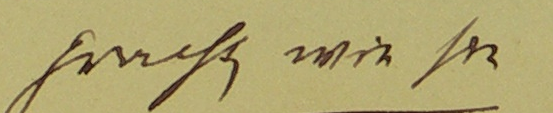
pracht wie sie
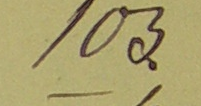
103
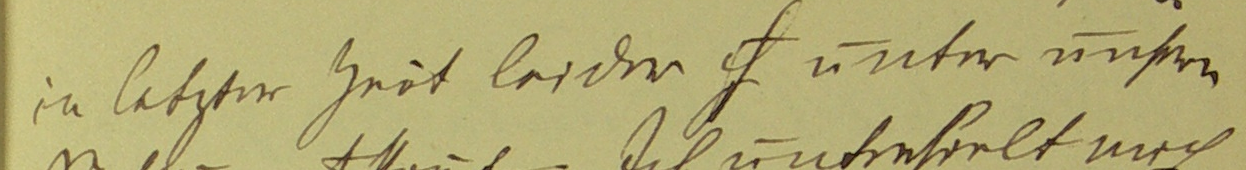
in letzter Zeit leider auch unter unseren
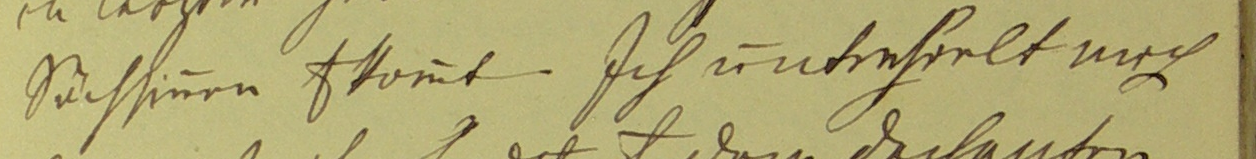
Sächsinnen auf kommt.- Ich unterhielt mich
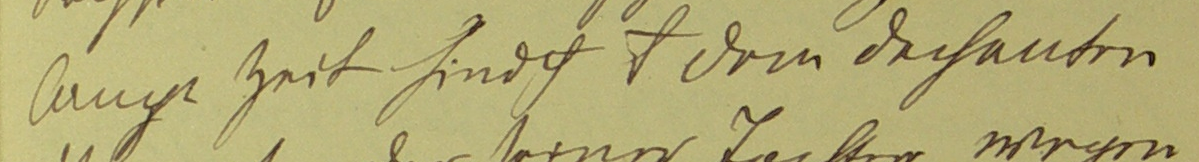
lange Zeit hindurch mit dem Dechanten
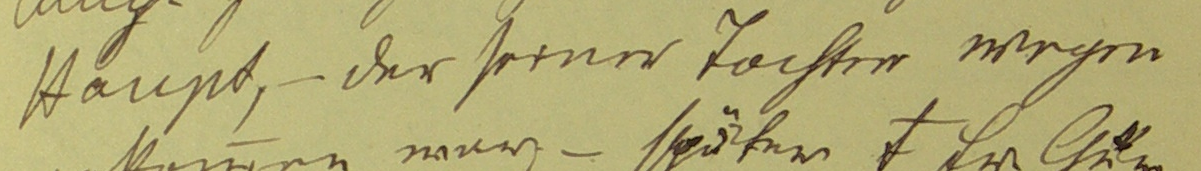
Haupt,- der seiner Tochter wegen
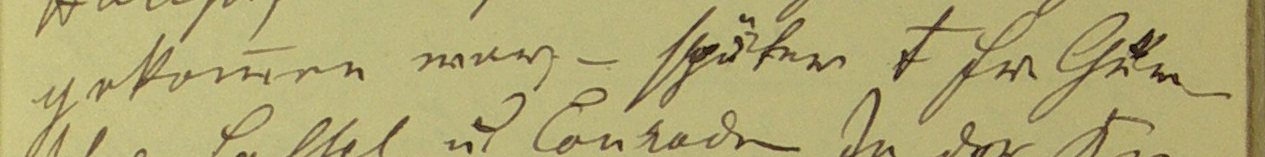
gekommen war- später mit Fr. Gün¬
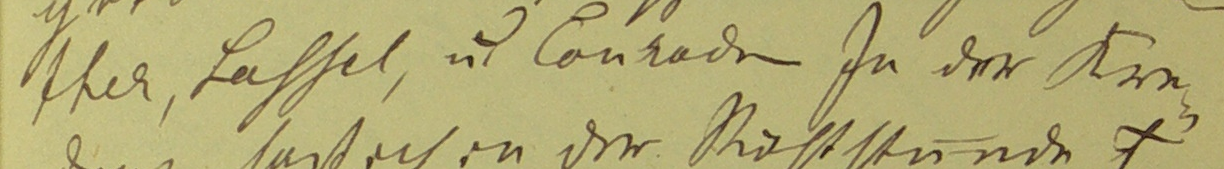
ther, Lassel und Conradi. In der Kre¬
